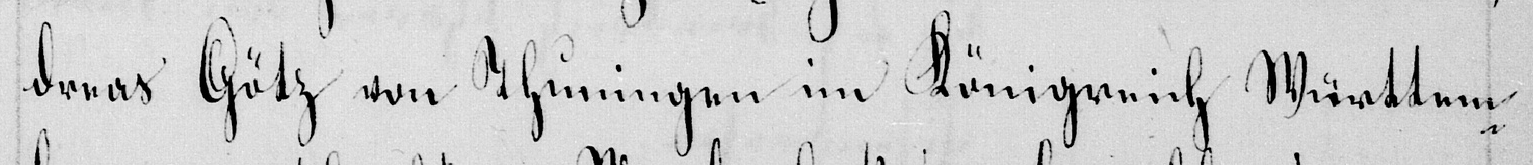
dreas Götz von Thuningen im Königreich Württem¬
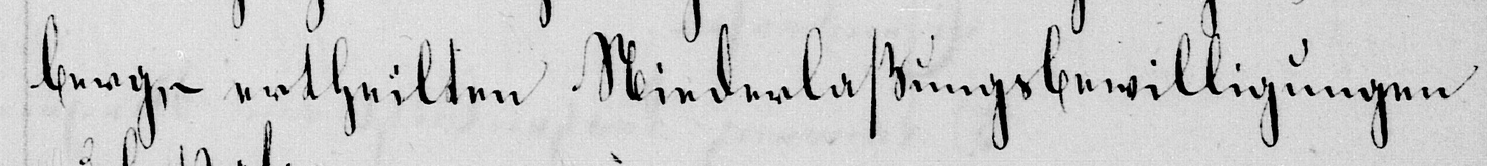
berg vertheilten Niederlaßungsbewilligungen
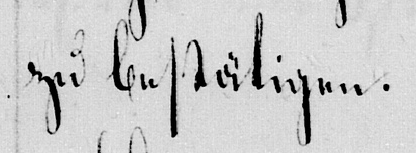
zu bestätigen.
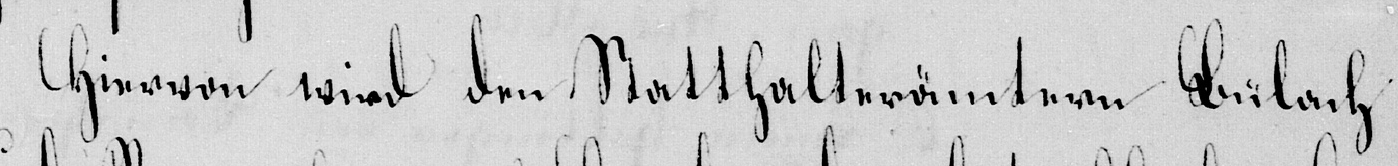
Hiervon wird dem Statthalteramte Bülach
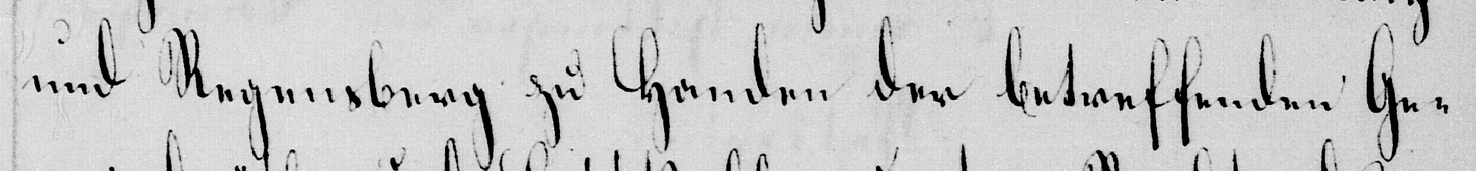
und Regensberg zu Handen der betreffenden Ge¬
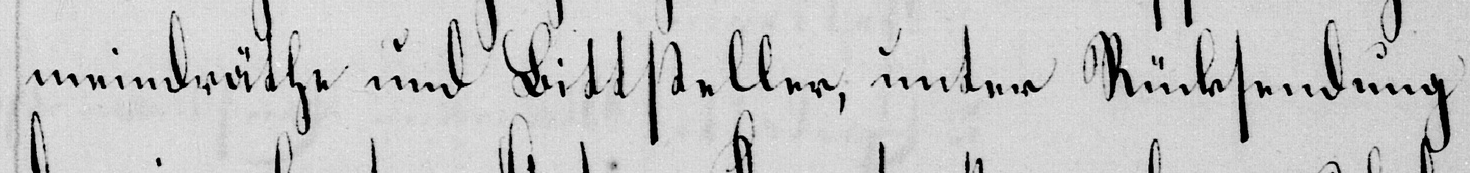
meindräthe und Bittsteller, unter Rücksendung
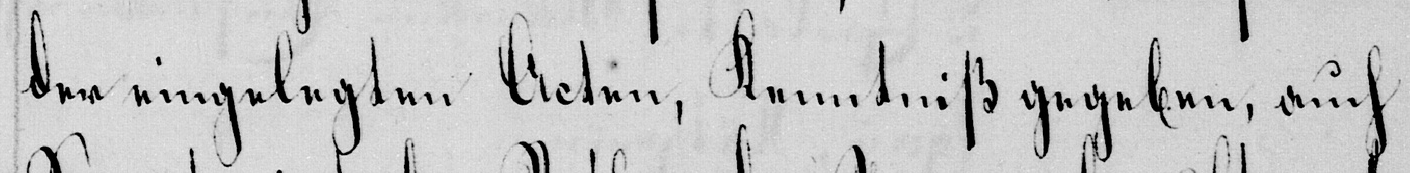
der eingelegten Acten, Kenntniß gegeben, auch
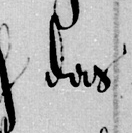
das
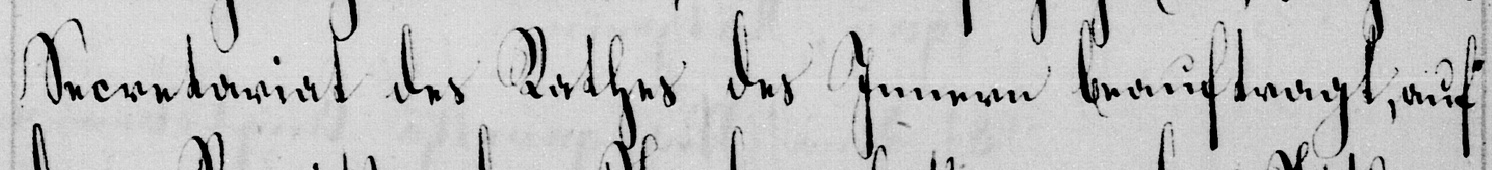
Secretariat des Rathes des Innern beauftragt, auf
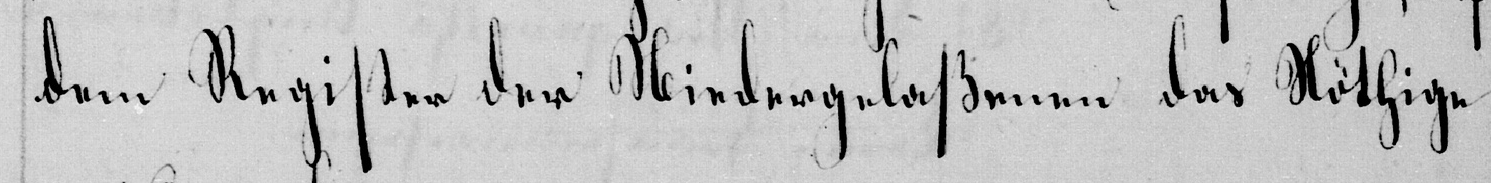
dem Register der Niedergelaßenen das Nöthige
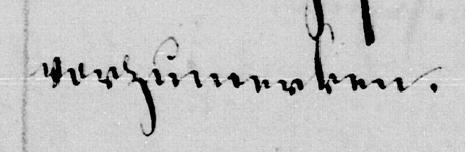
vorzumerken.
